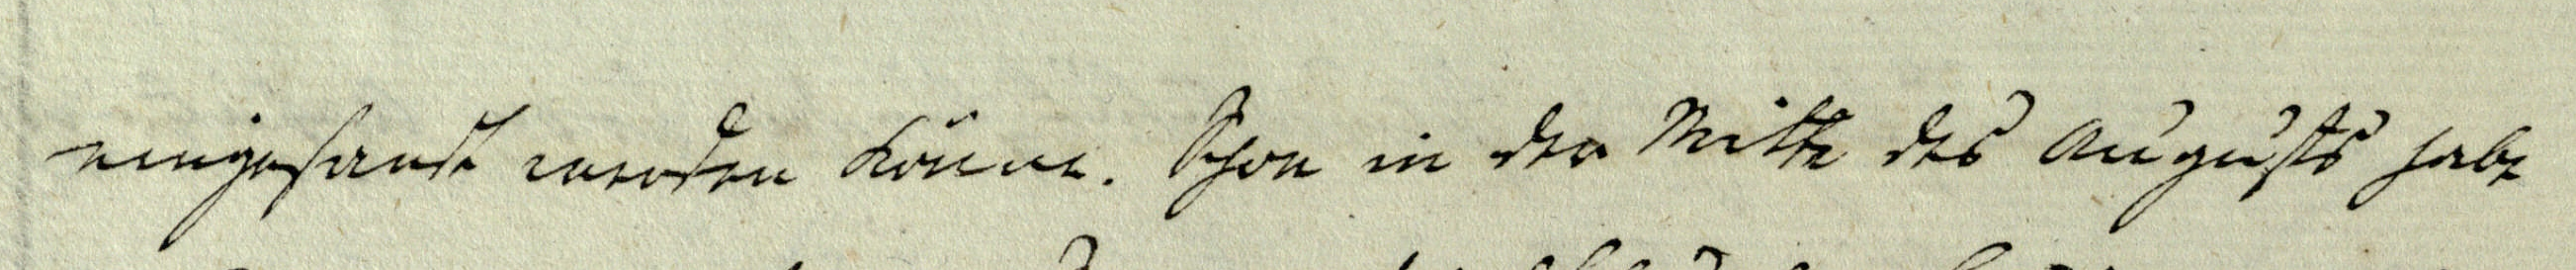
eingesandt werden könne. Schon in der Mitte des Augusts habe
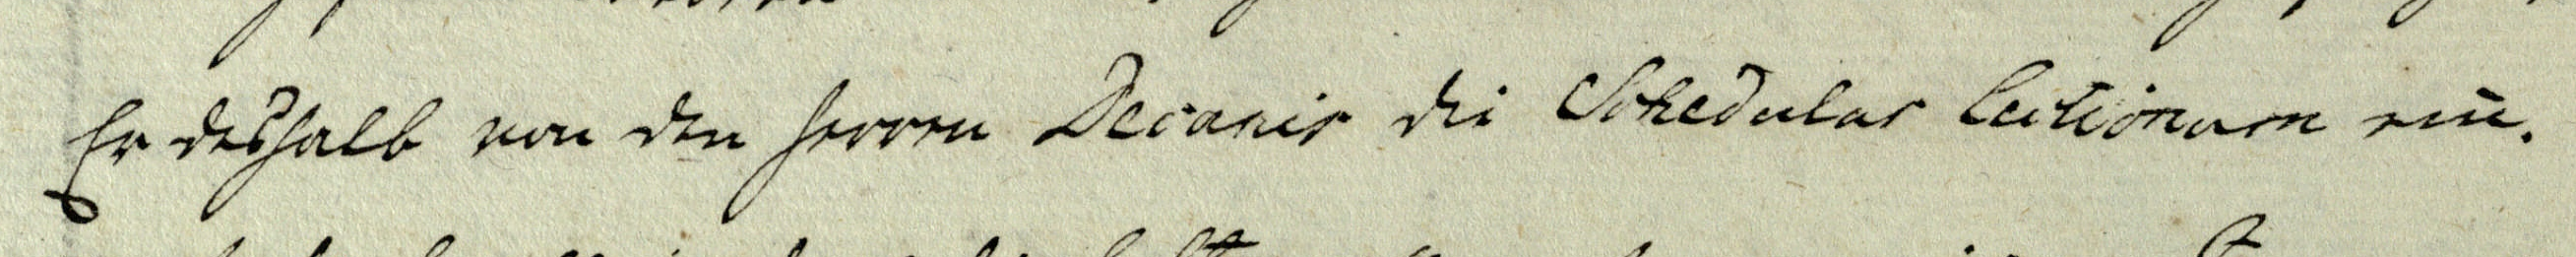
Er deshalb von den Herren Decanis die Schedulas Lectionum ein¬
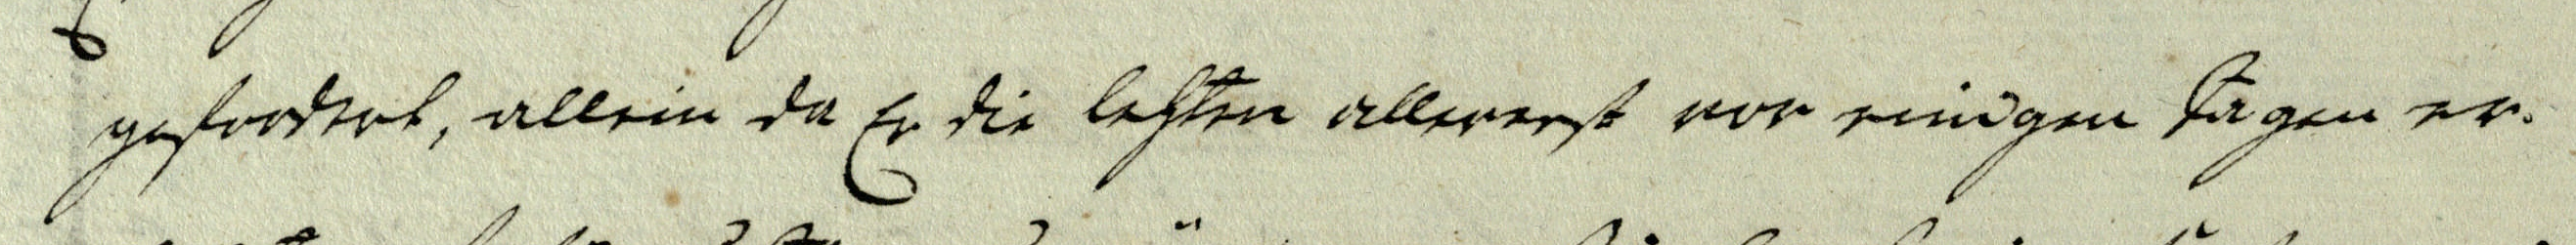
gefordert, allein da Er die letzten allererst vor einigen Tagen er¬
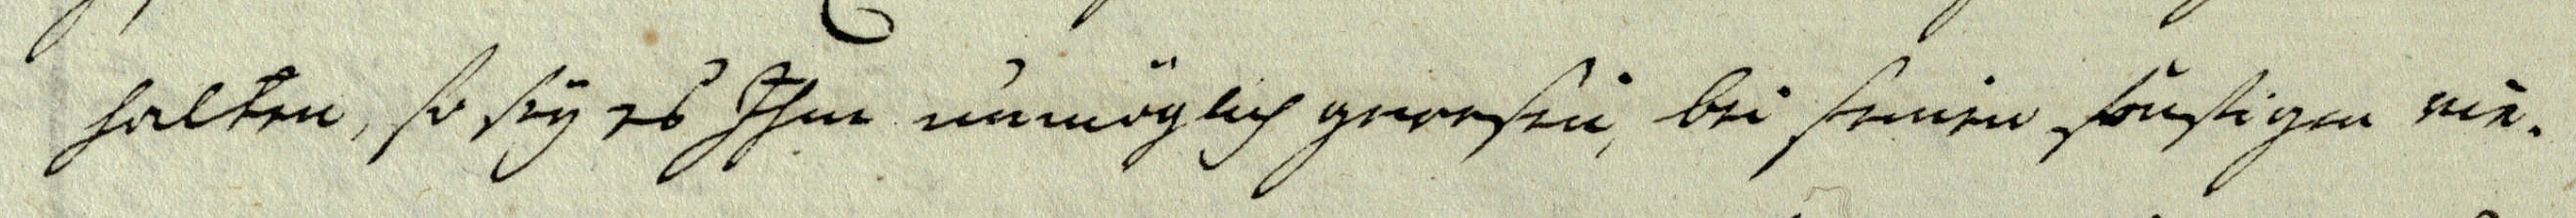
halten, so seÿ es Ihm unmöglich gewesen, bei seinen sonstigen vie¬
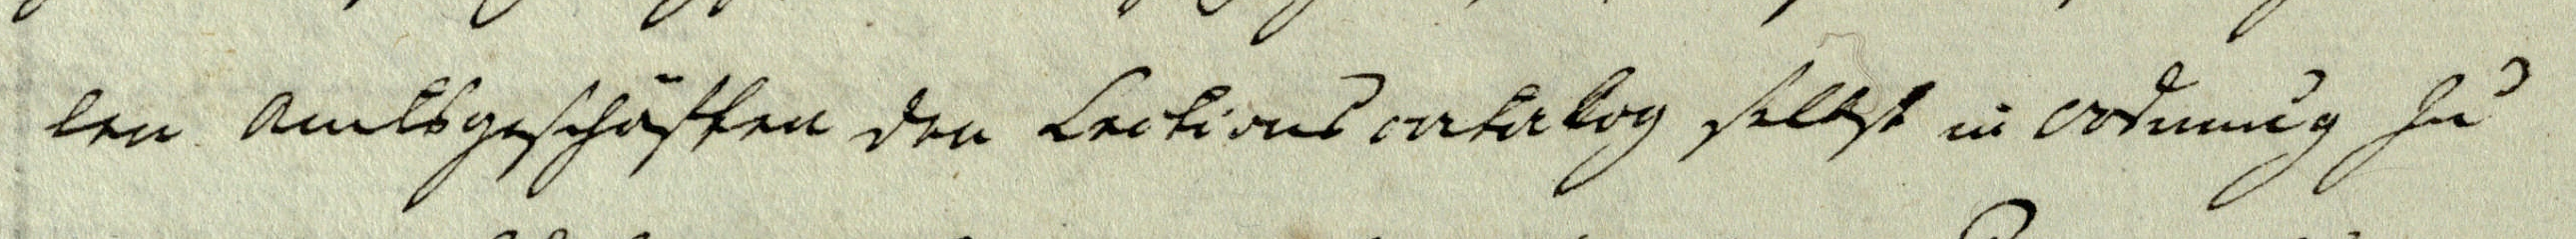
len Amtsgeschäften den Lectionscatalog selbst in Ordnung zu
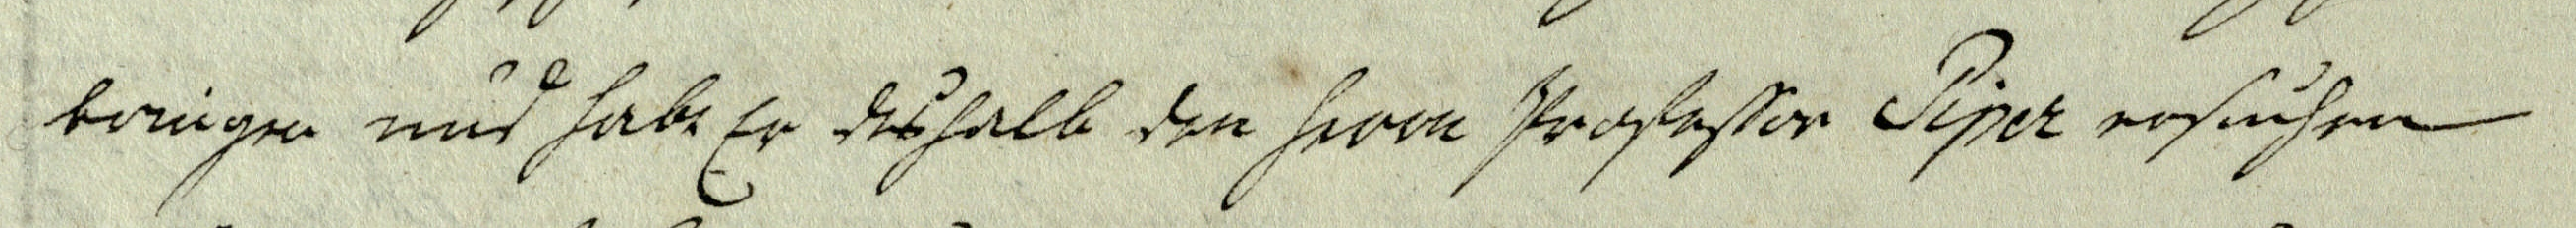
bringen und habe Er deshalb den Herrn Professor Piper ersuchen
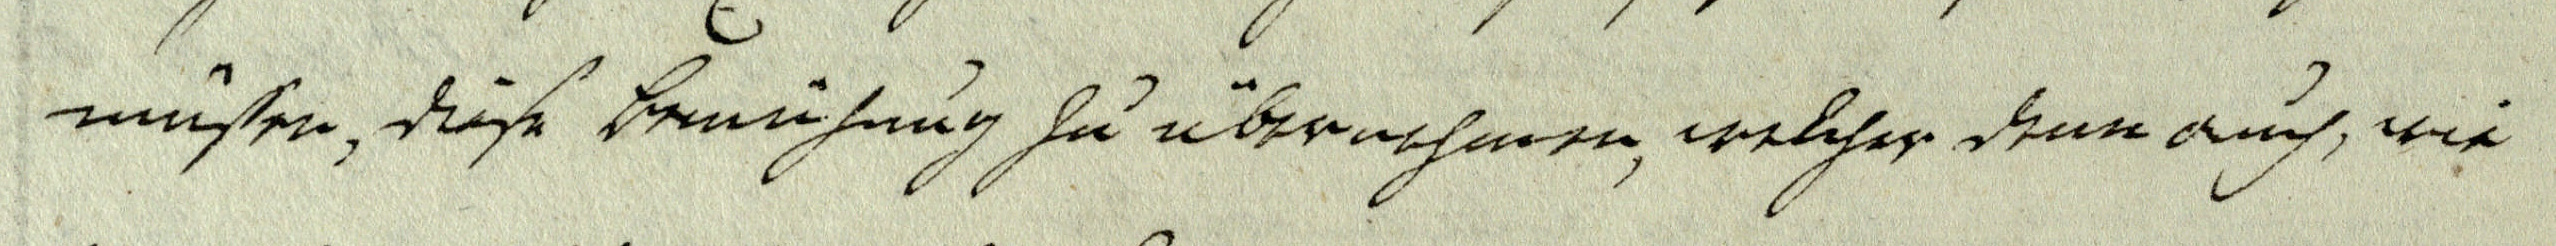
müssen, diese Bemühung zu übernehmen, welcher denn auch, wie
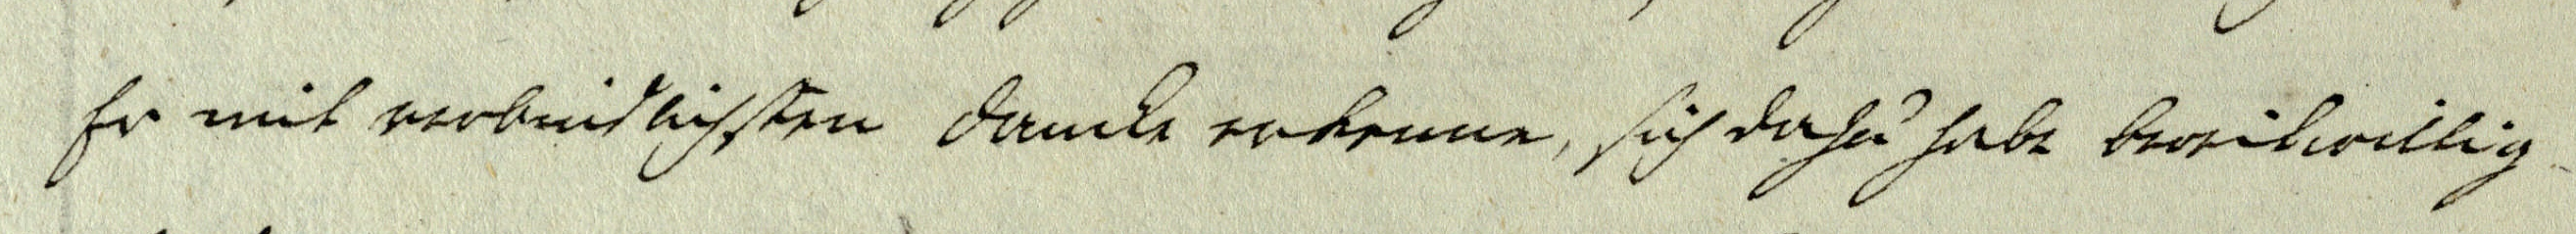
Er mit verbindlichsten Danke erkenne, sich dazu habe bereitwillig
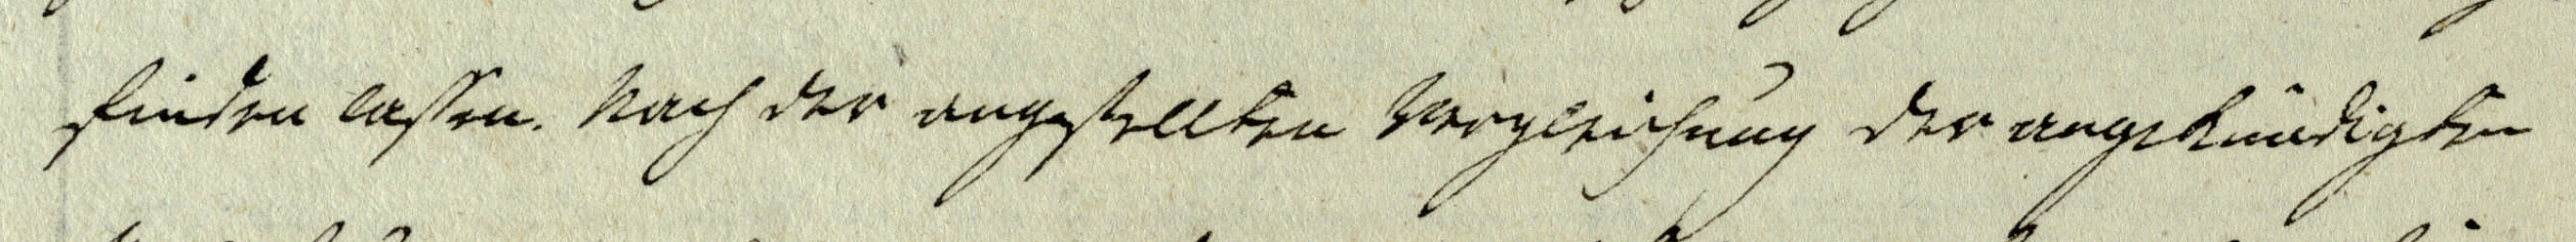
finden lassen. Nach der angestellten Vergleichung der angekündigten
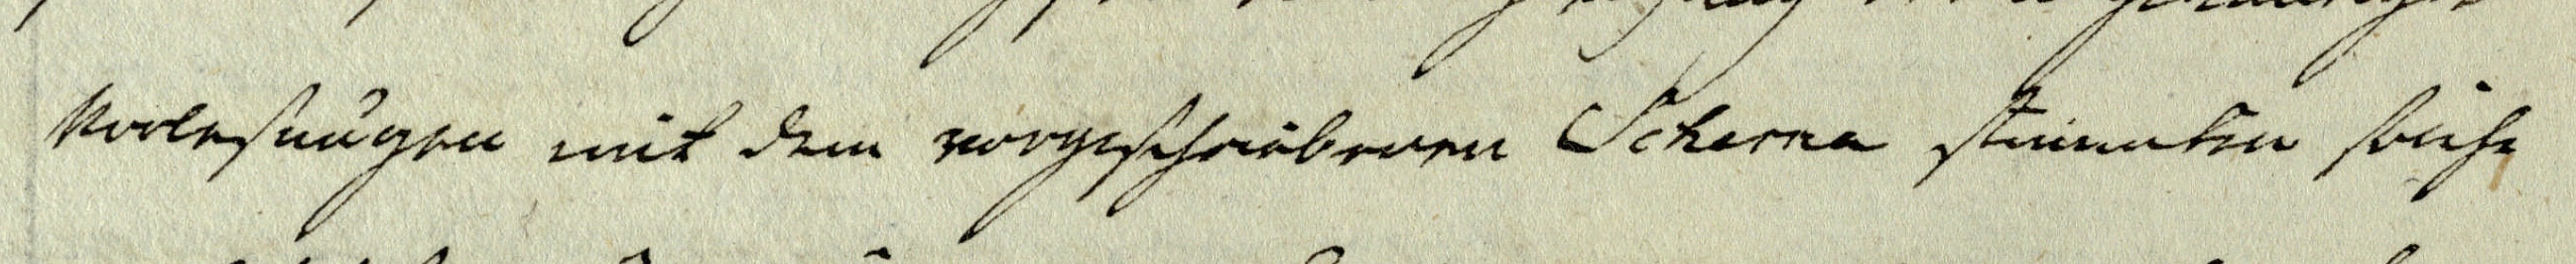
Vorlesungen mit dem vorgeschriebenen Schema stimmten solche
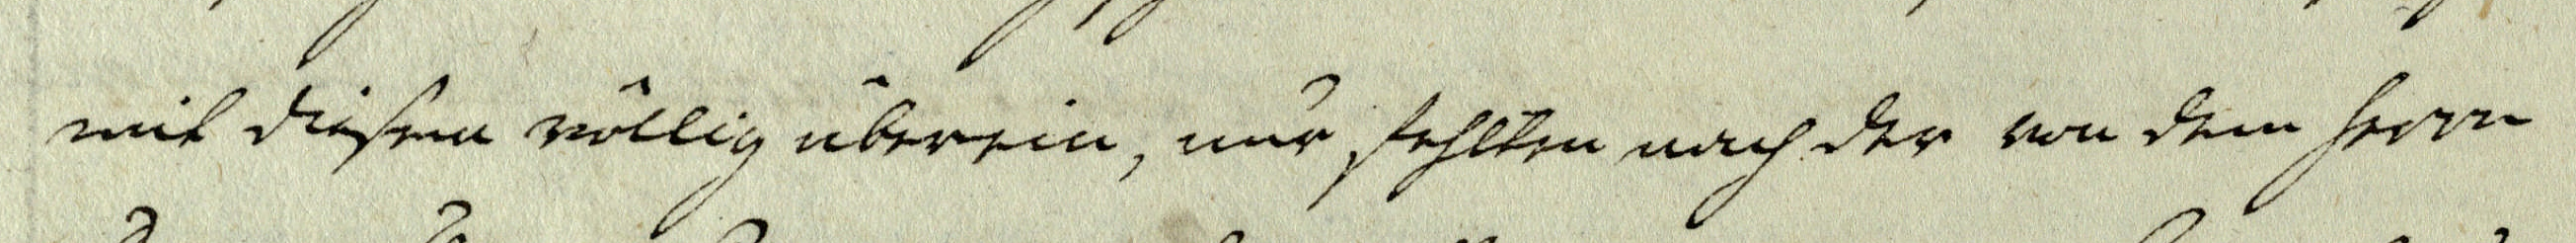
mit diesem völlig überein, nur fehlten nach der von dem Herrn
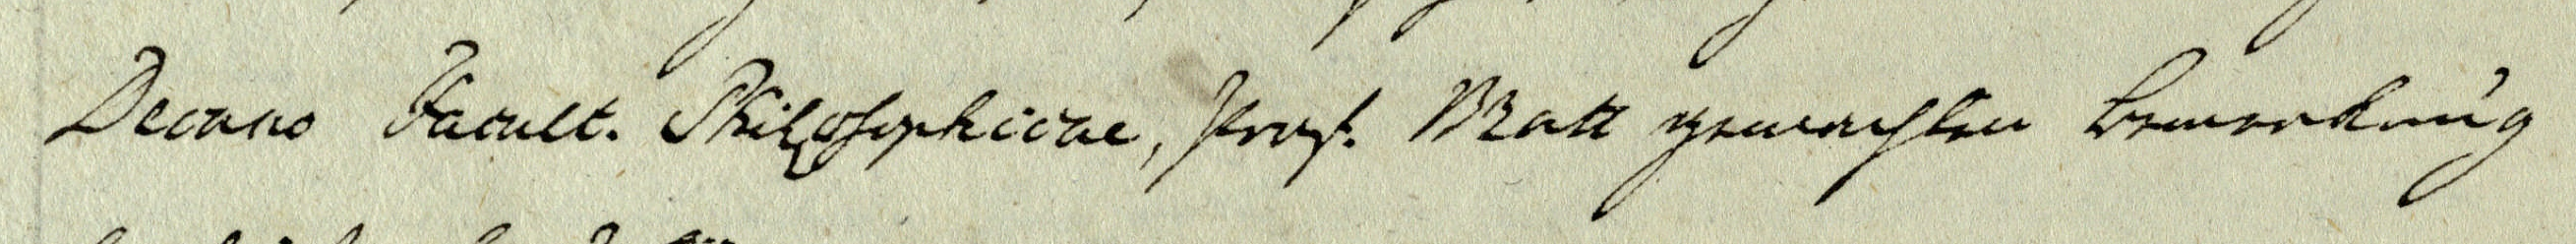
Decano Facult. Philosophicae, Prof. Bratt gemachten Bemerkung
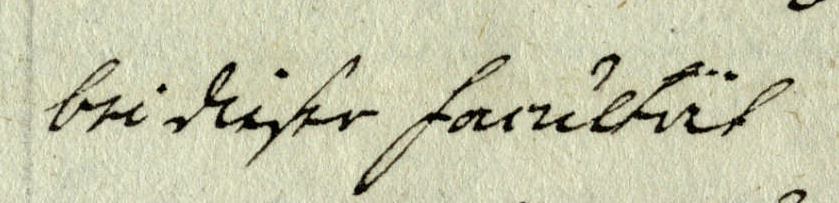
bei dieser Facultät
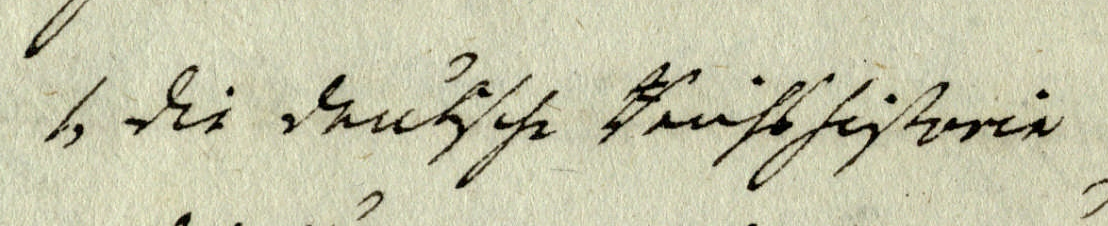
1, die deutsche Reichshistorie
